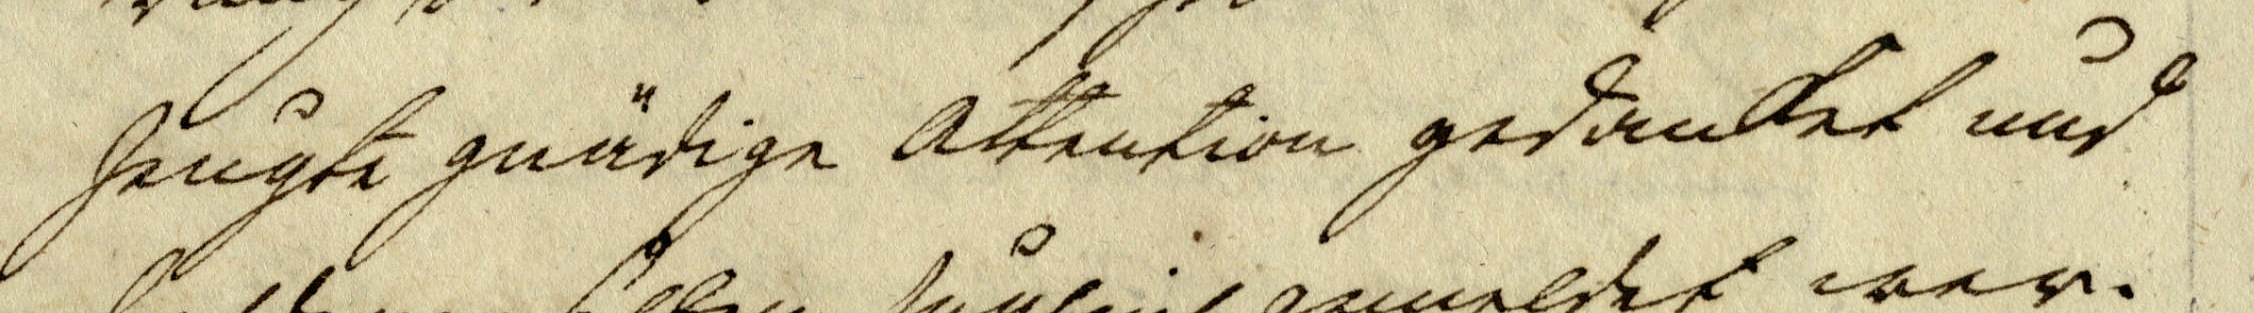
zeugte gnädige Attention gedanket und
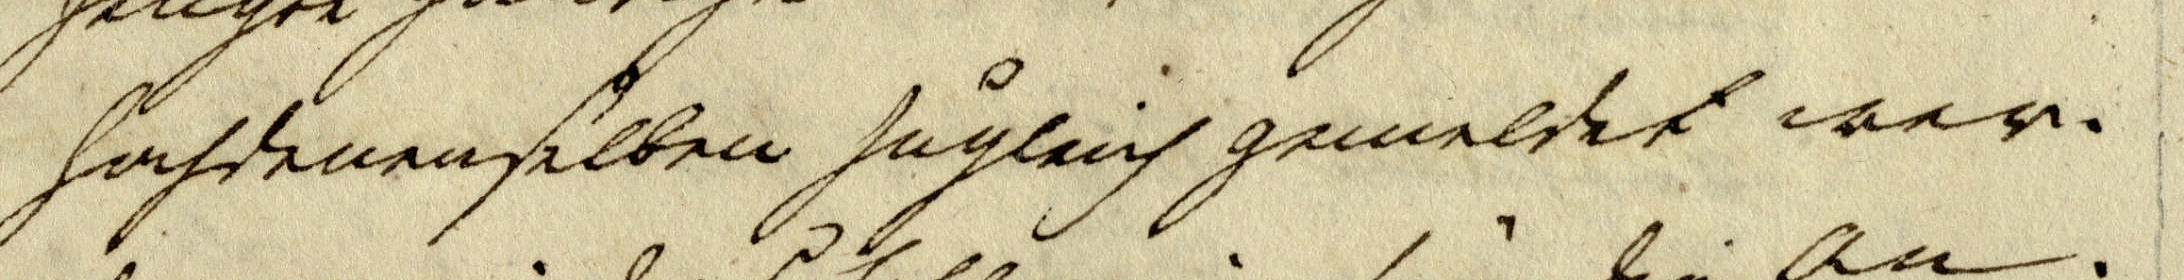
Hochdenenselben zugleich gemeldet wer¬
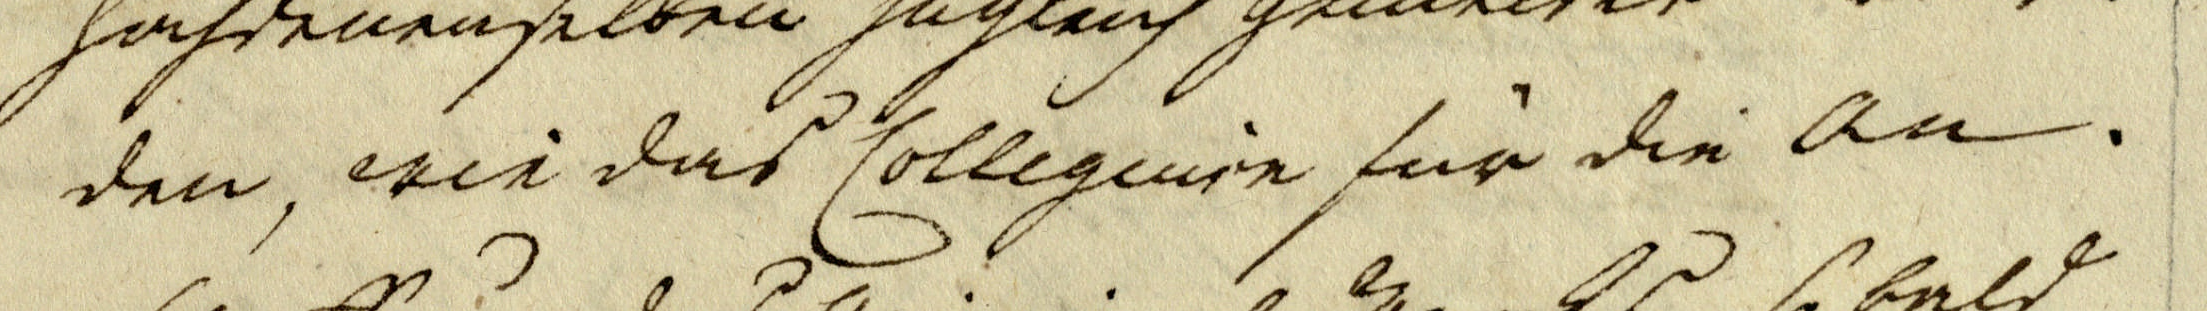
den, wie das Collegium für die An¬
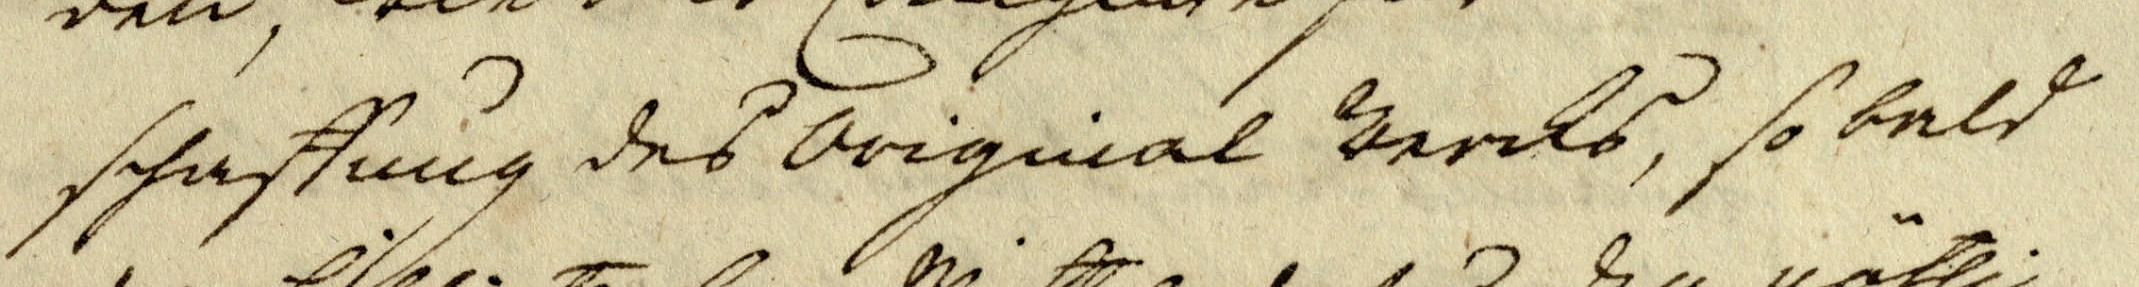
schaffung des Original Wercks, so bald
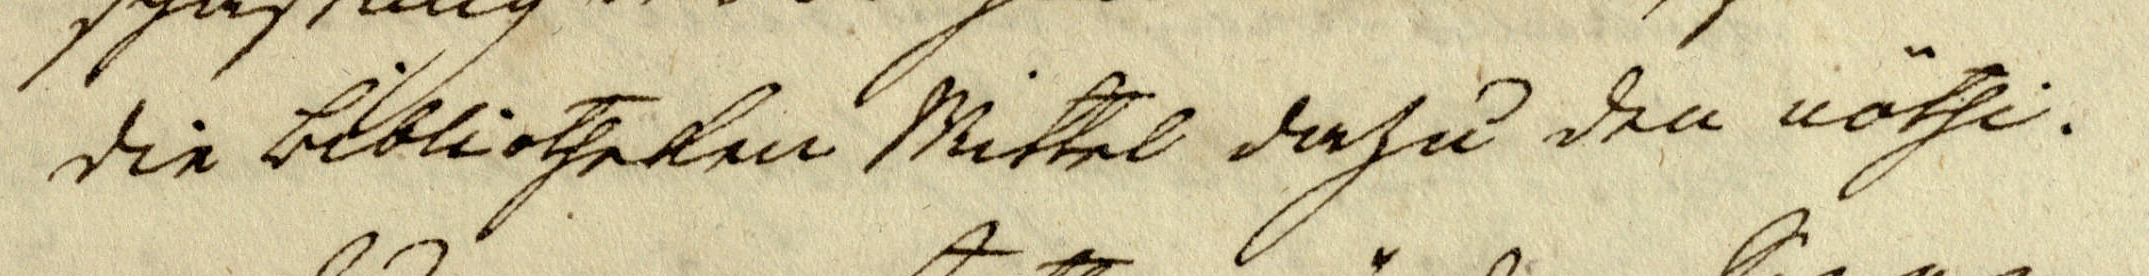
die Bibliotheken Mittel dazu den nöthi¬
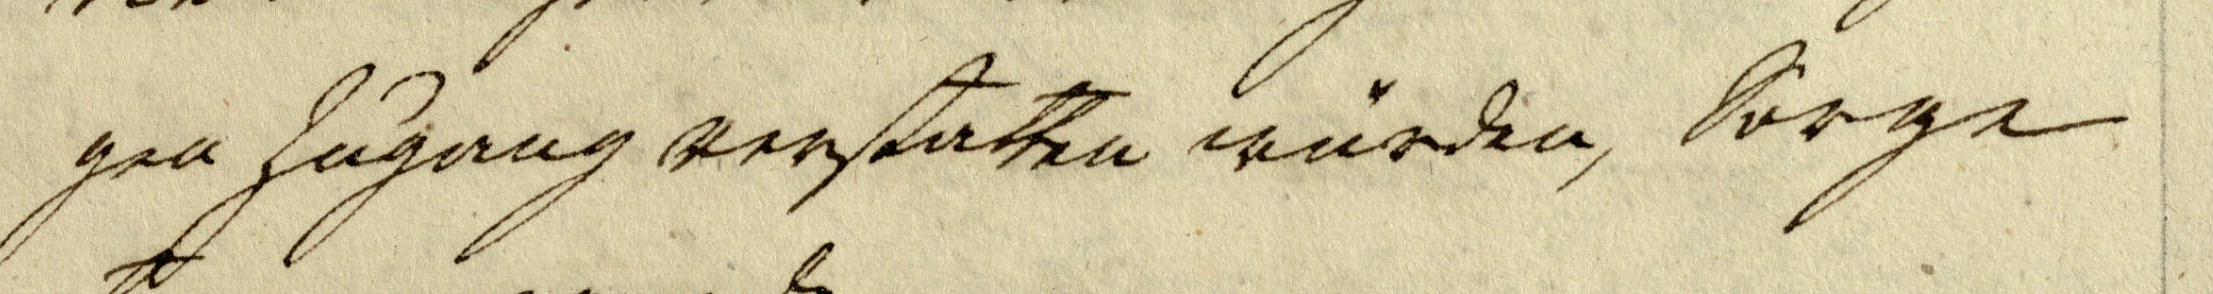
gen Zugang verstatten würden, Sorge
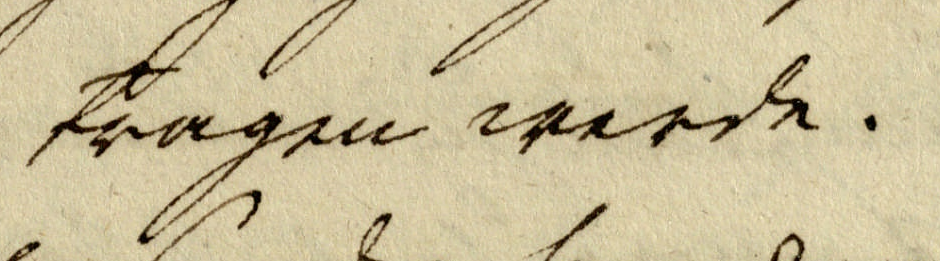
tragen werde.
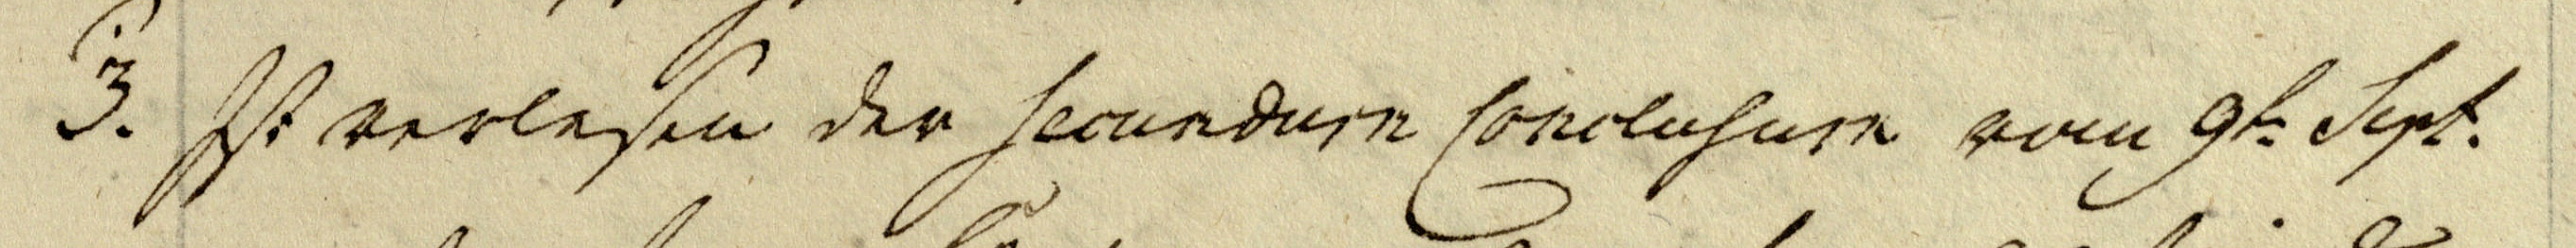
3. Ist verlesen der secundum Conclusum vom 9 te Sept.
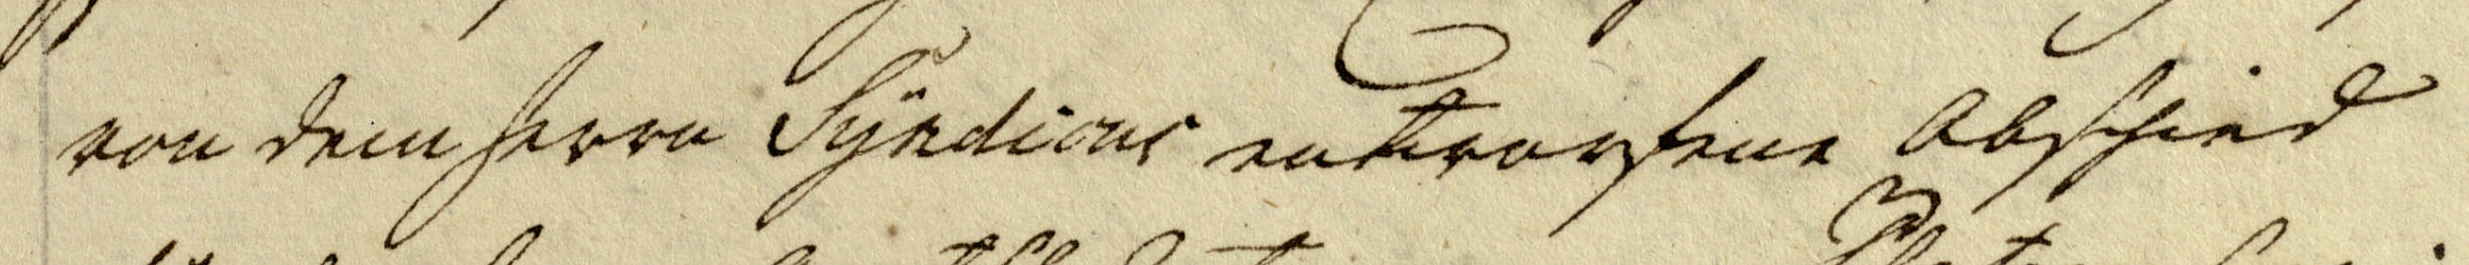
von dem Herrn Sÿndicus entworfene Abschied
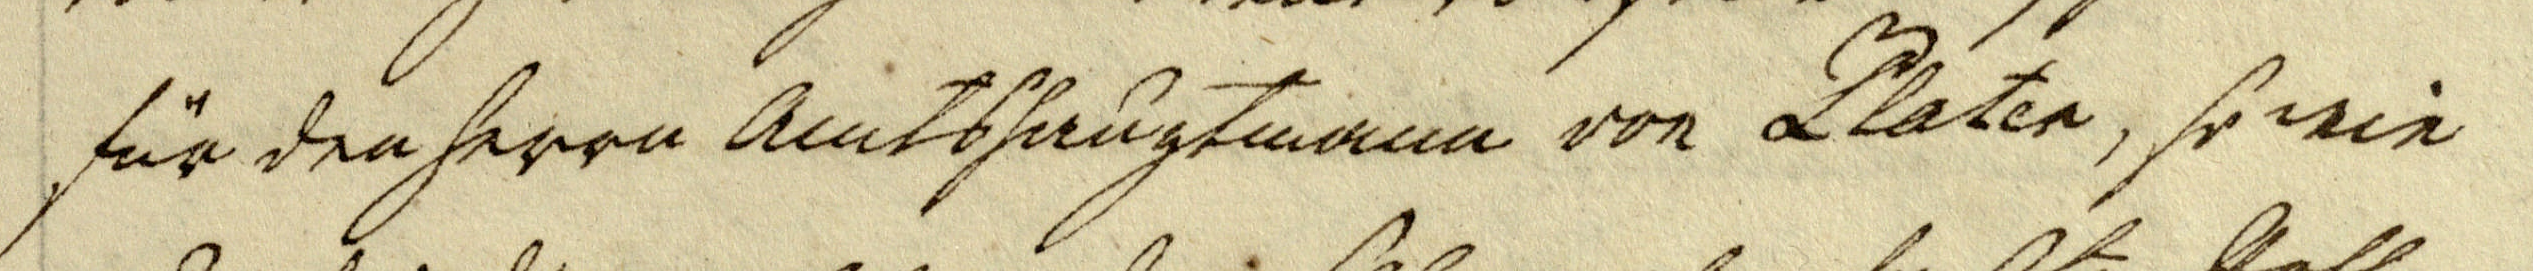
für den Herrn Amtshauptmann von Platen, so wie
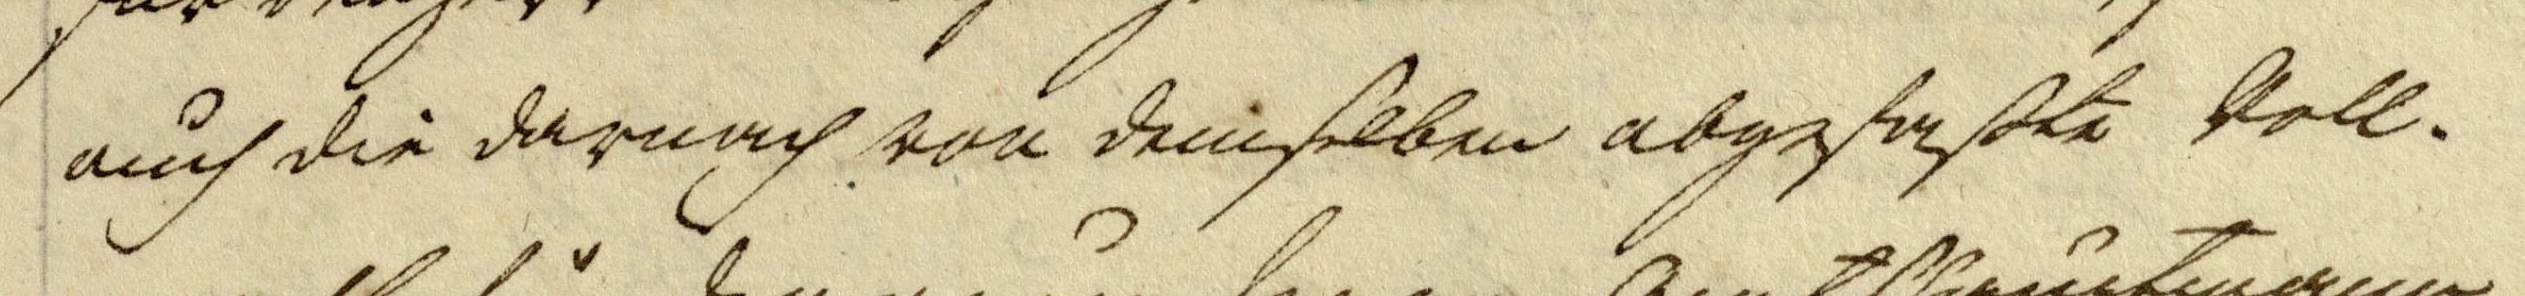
auch die darnach von demselben abgefaßte Voll¬
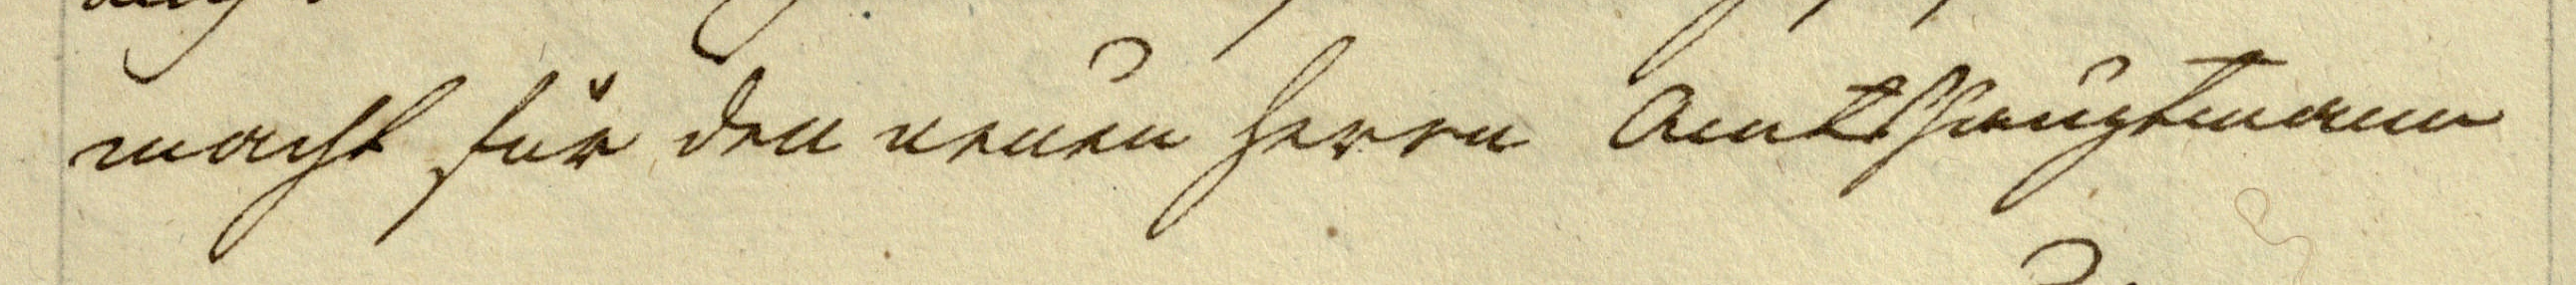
macht für den neuen Herrn Amtshauptmann
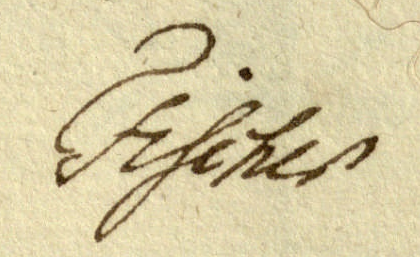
Fischer
